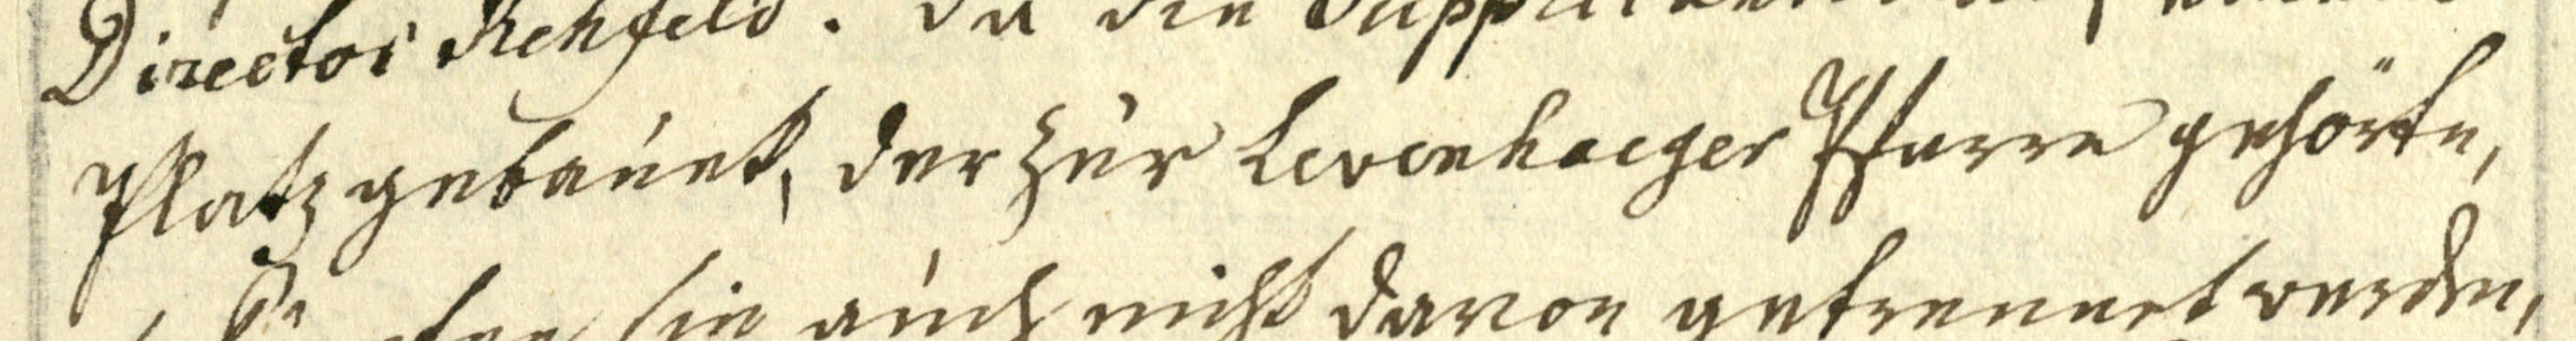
Platz gebauet, der zur Levenhaeger Pfarre gehörte,
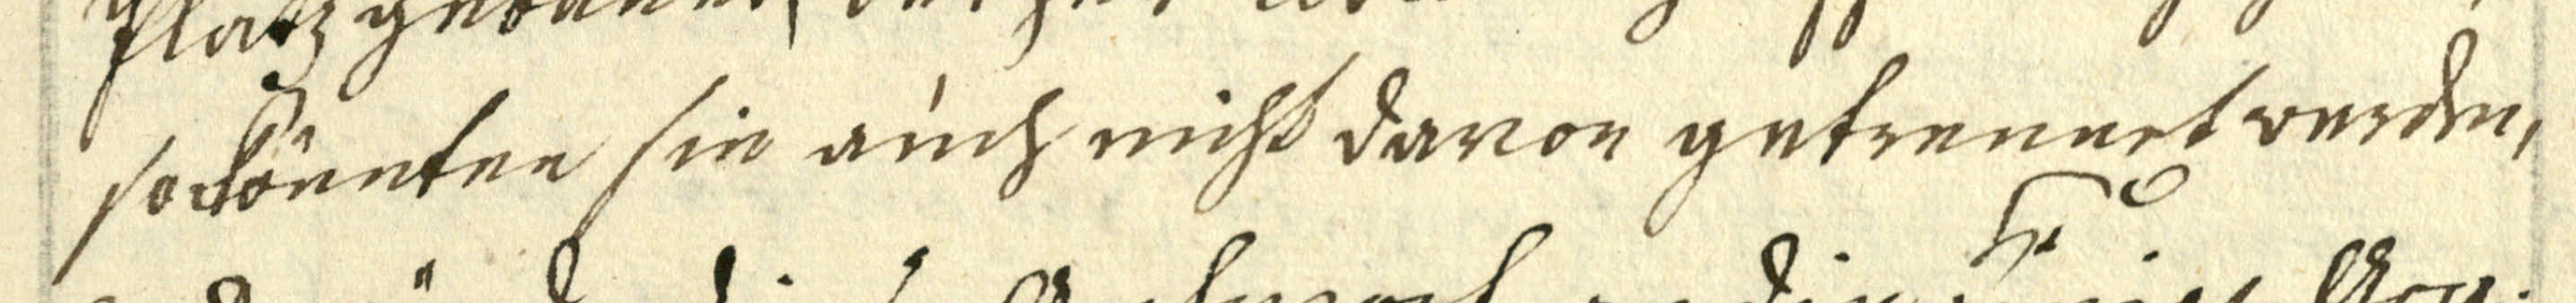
so könnten sie auch nicht davon getrennet werden,
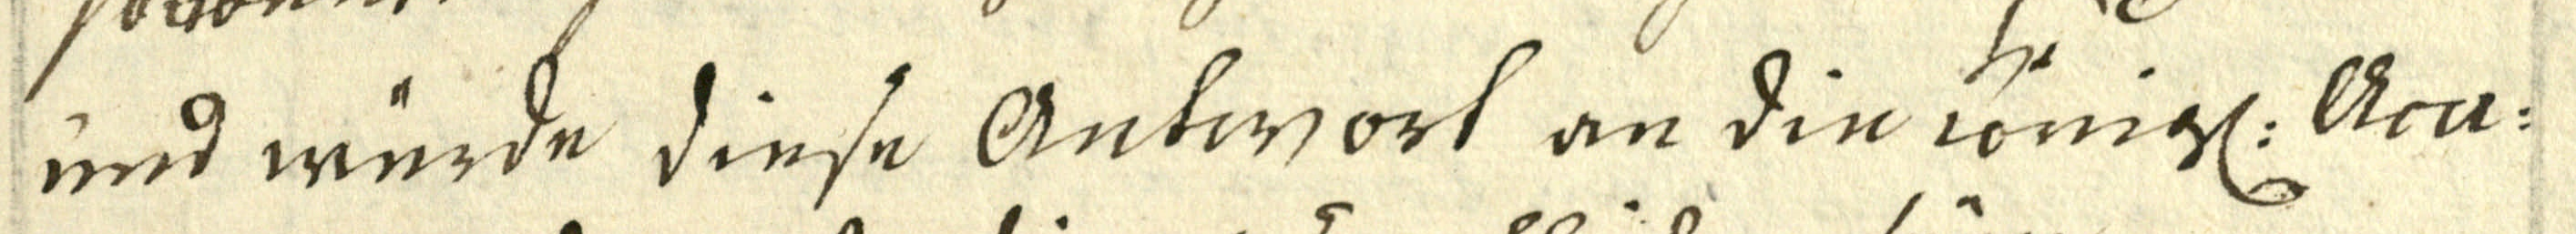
und würde diese Antwort an die Königl. Aca¬
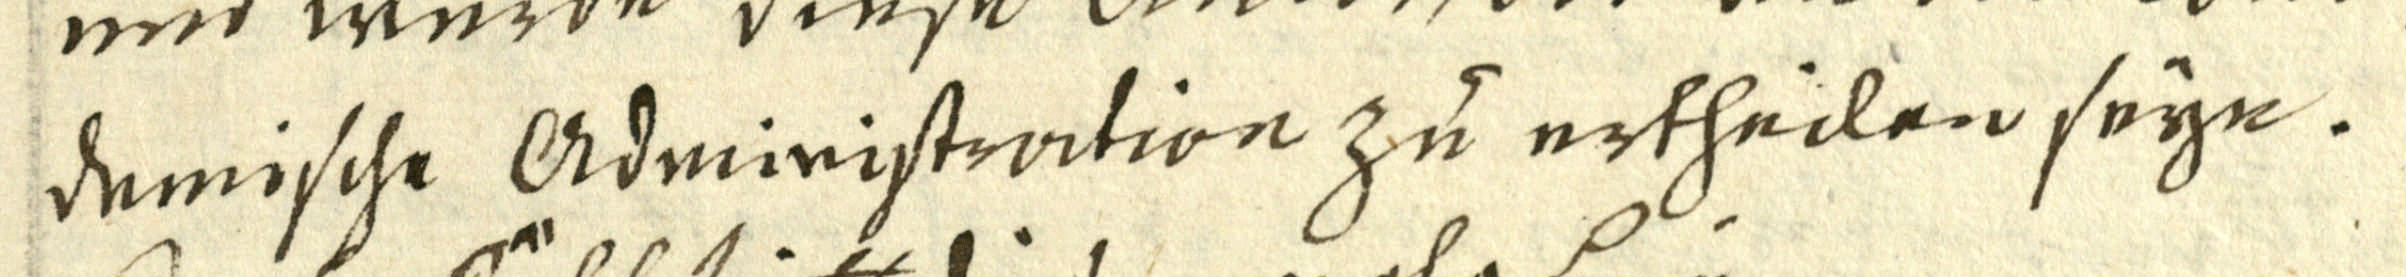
demische Administration zu ertheilen seÿn.
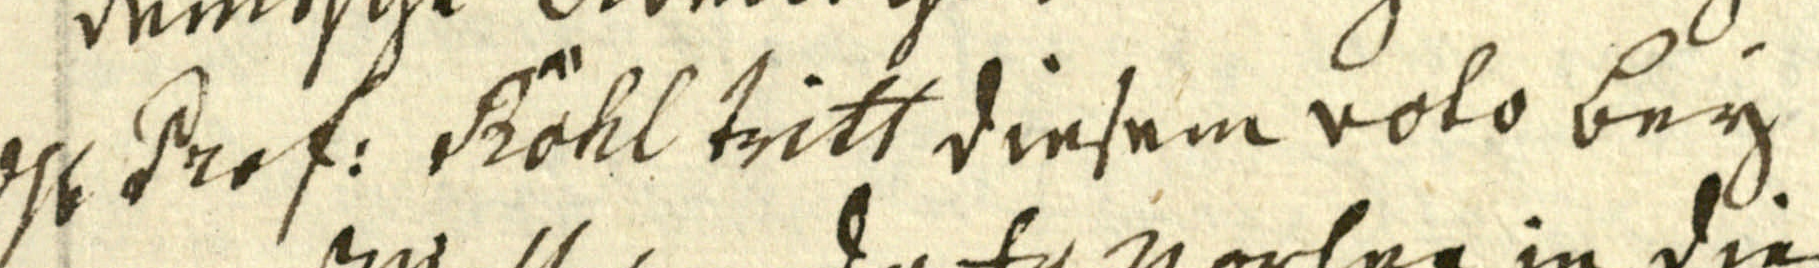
dh Prof. Röhl tritt diesem voto beÿ
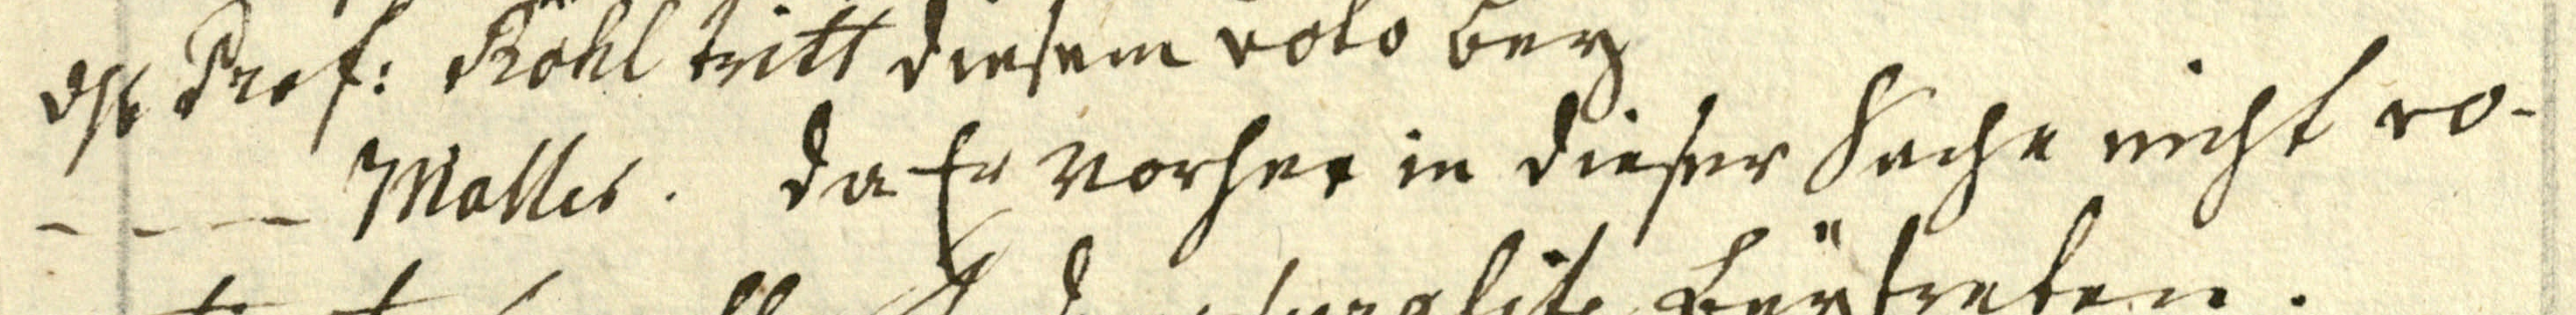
Möller. da Er vorher in dieser Sache nicht vo¬
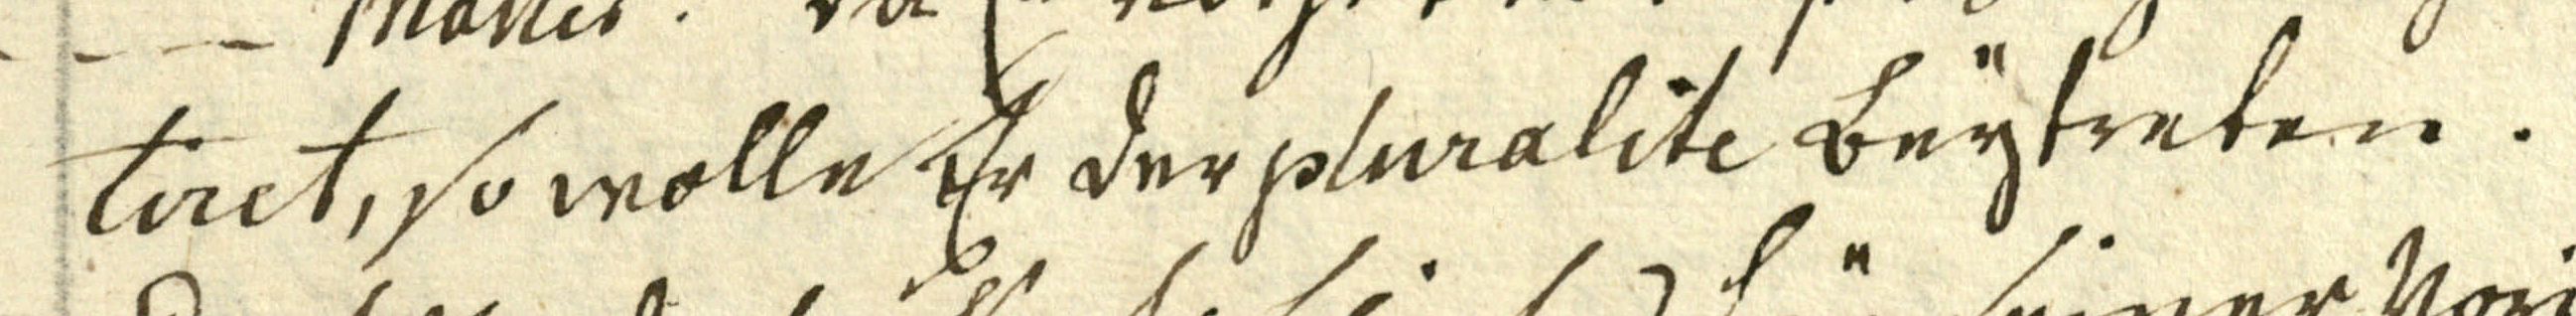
tiret, so wolle Er der pluralite beÿtreten.
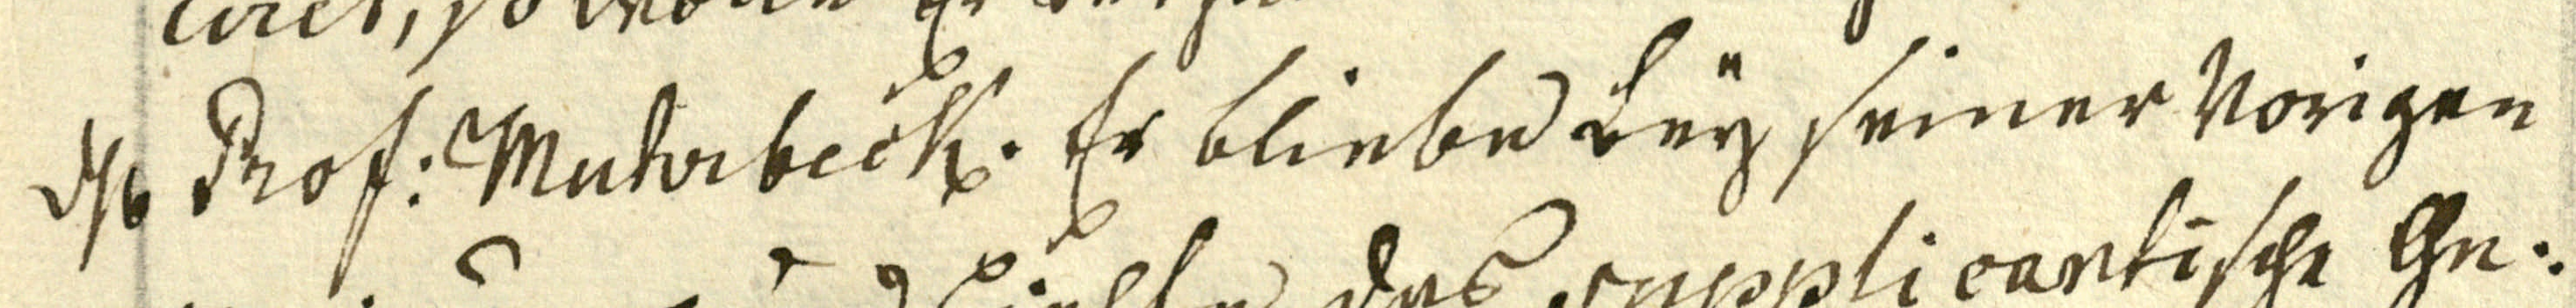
dh Prof. Muhrbeck. Er bliebe beÿ seiner vorigen
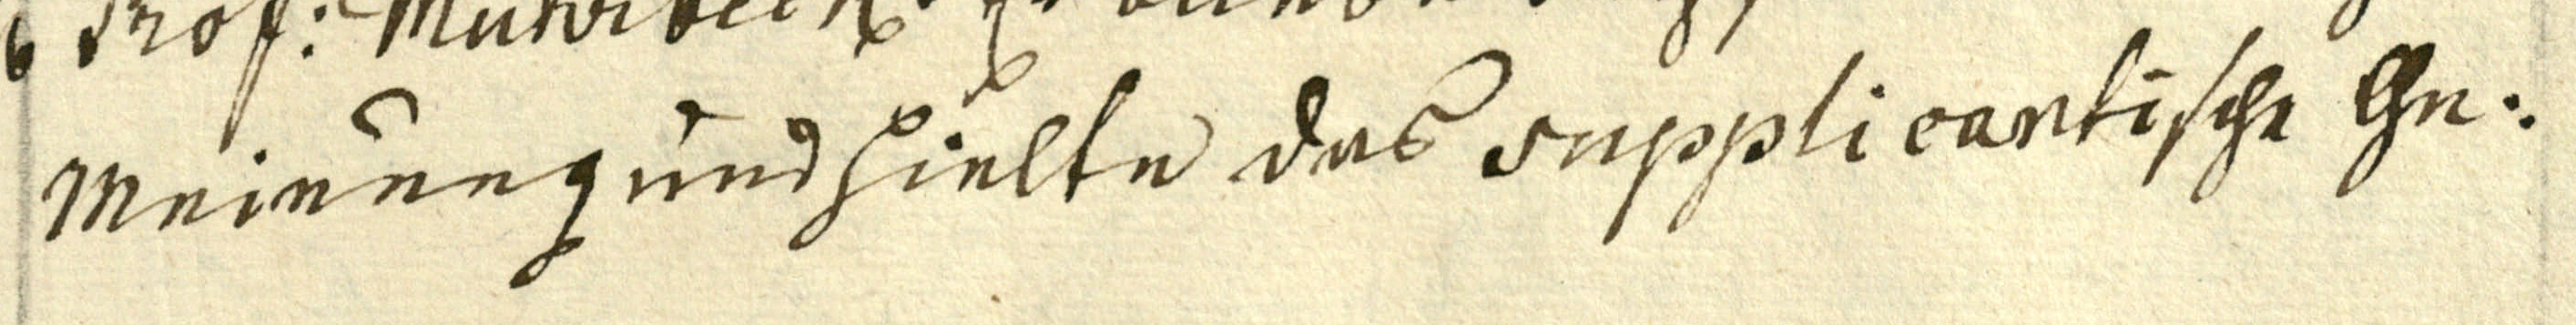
Meinung und hielte das supplicantische Ge¬
